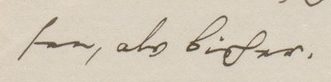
sen, als bisher.
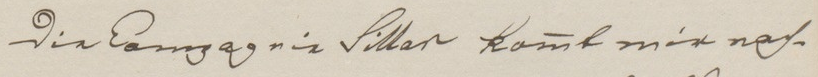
Die Compagnie Sillar kommt mir nach-
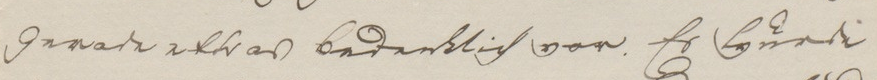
gerade etwas bedenklich vor. Es würde
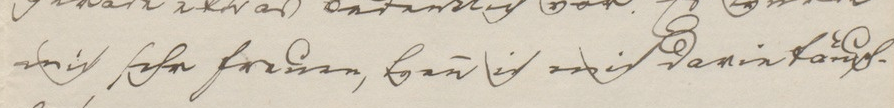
mich sehr freuen, wenn ich mich darin täusch-
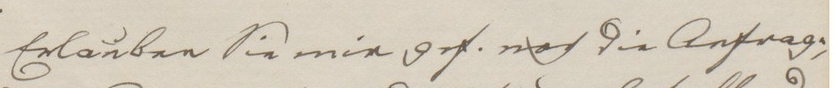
Erlauben Sie mir gef. noch die Anfrage,
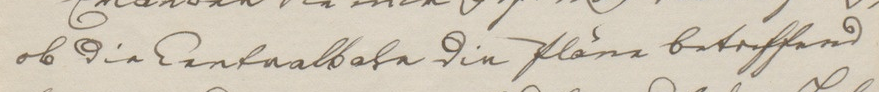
ob die Centralbahn die Pläne betreffend
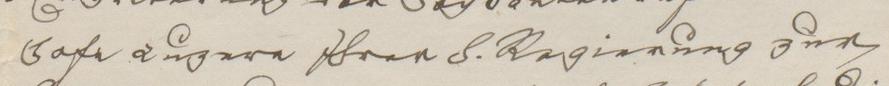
hofe Luzern Ihrer h. Regierung zur
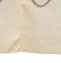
die
